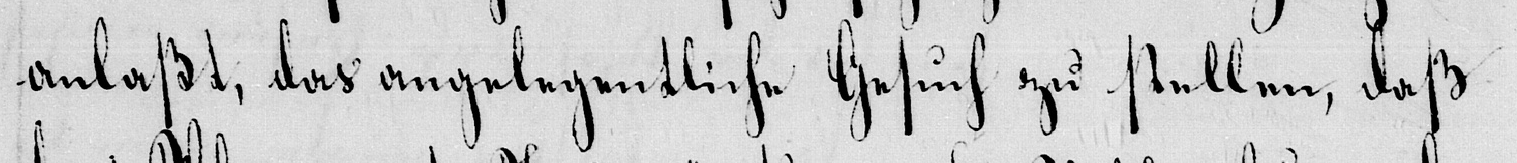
anlaßt, das angelegentliche Gesuch zu stellen, daß
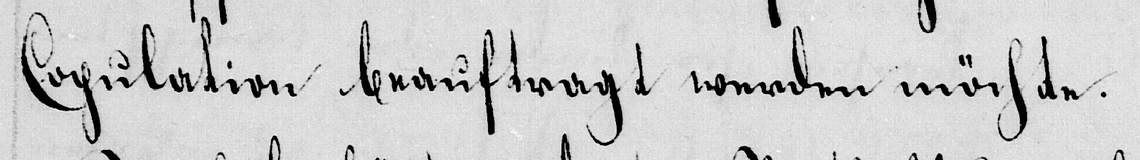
Copulation beauftragt werden möchte.
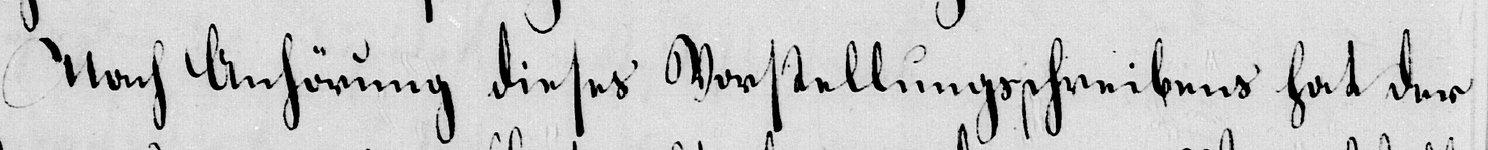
Nach Anhörung dieses Vorstellungsschreibens hat der
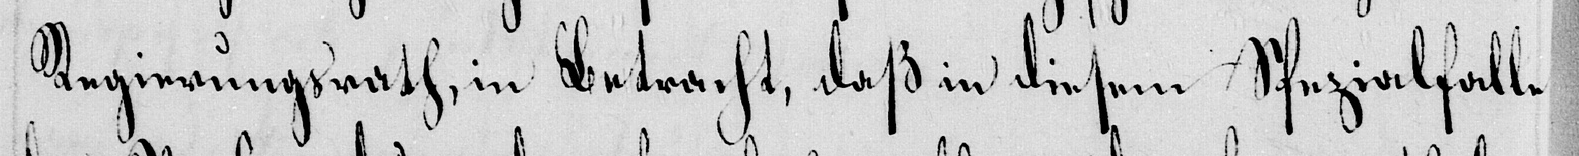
Regierungsrath, in Betracht, daß in diesem Spezialfalle
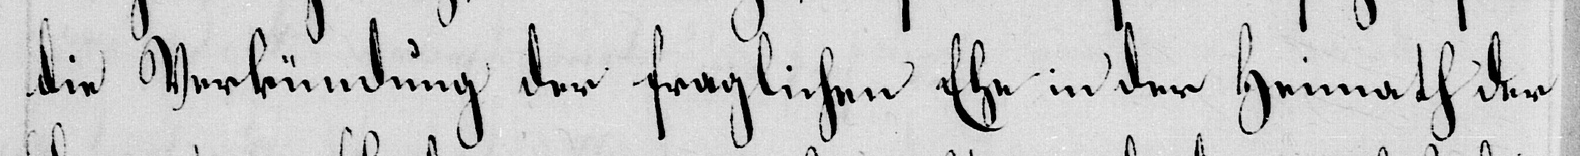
die Verkündung der fraglichen Ehe in der Heimath der
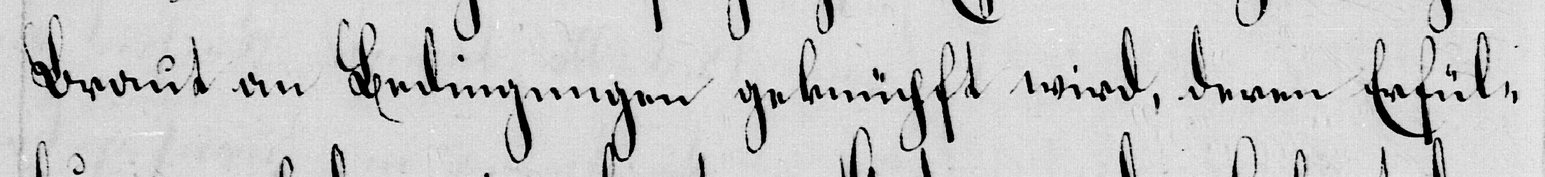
Braut an Bedingungen geknüpft wird, deren Erfül¬
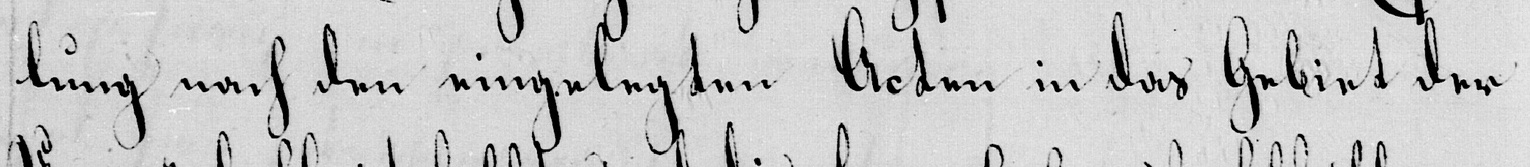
lung nach den eingelegten Acten in das Gebiet der
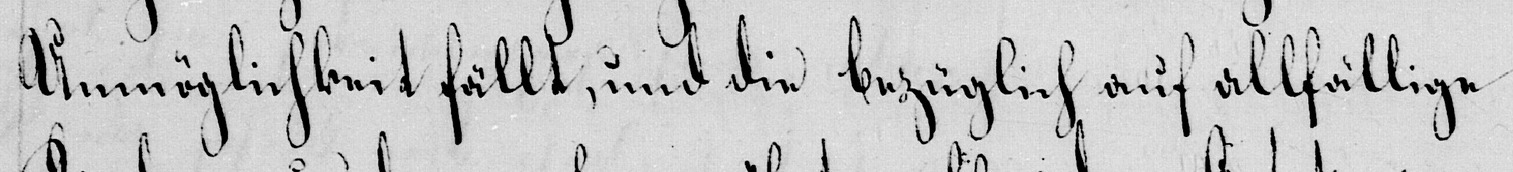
Unmöglichkeit fällt, und die bezüglich auf allfällige
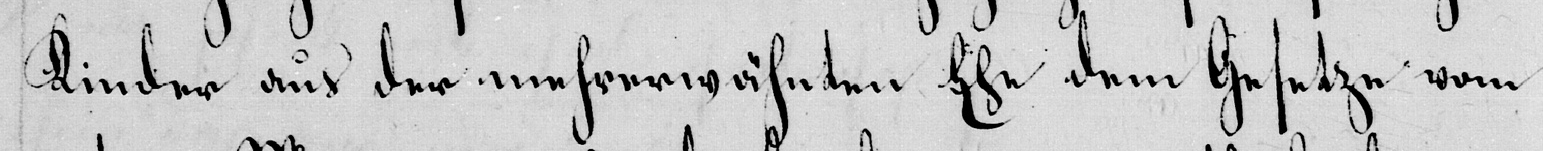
Kinder aus der mehrerwähnten Ehe dem Gesetze vom
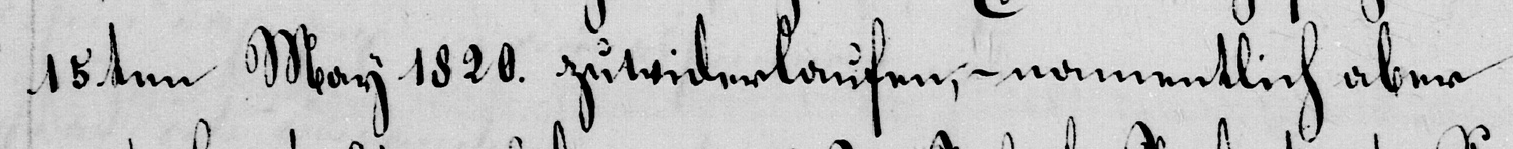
18ten May 1820. zuwiderlaufen, – nahmentlich aber
